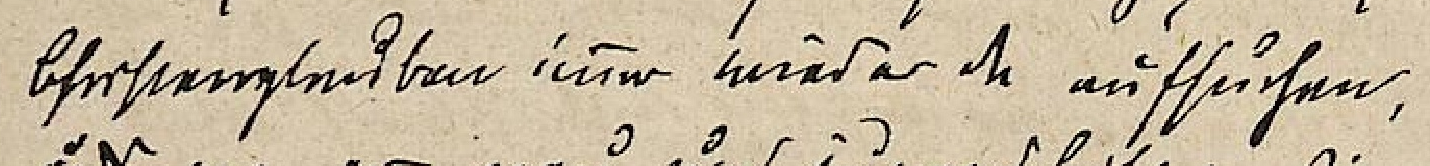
Christenglauben imer wieder da aufsuchen,
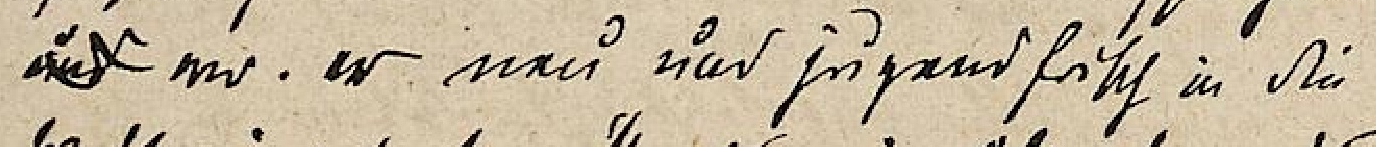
und wo er neu und jugendfrisch in die
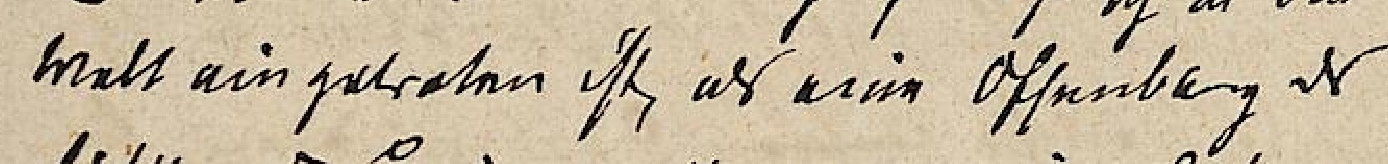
Welt eingetreten ist, als eine Offenbarng ds
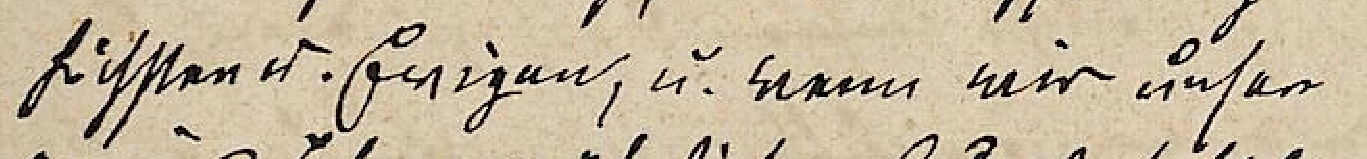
höchsten u. Ewigen, u. wenn wir unser
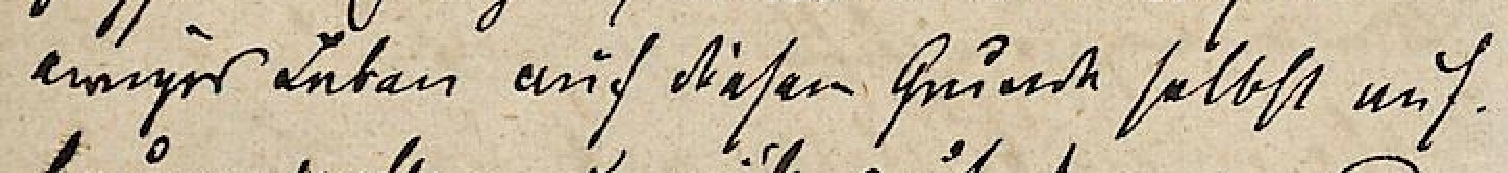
ewiges Leben auf diesem Grunde selbst auf¬
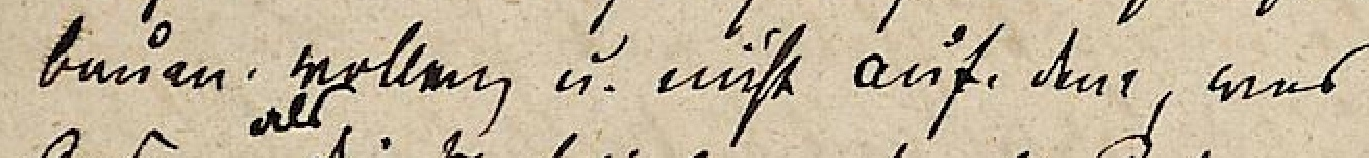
bauen. wollen, u. nicht auf. dem, was
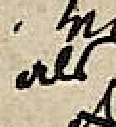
als
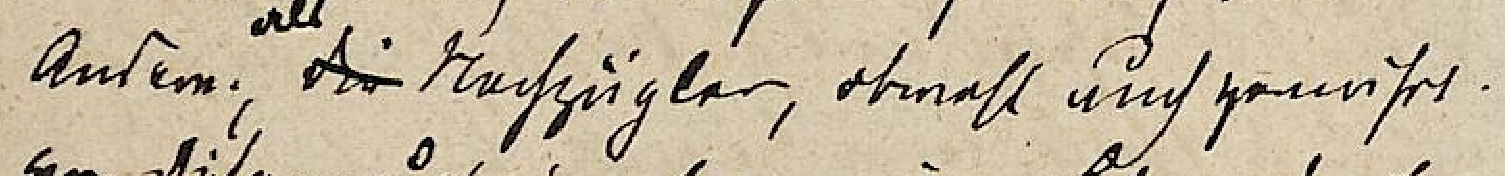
Andere., die Nachzügler, obwohl auch genährt.
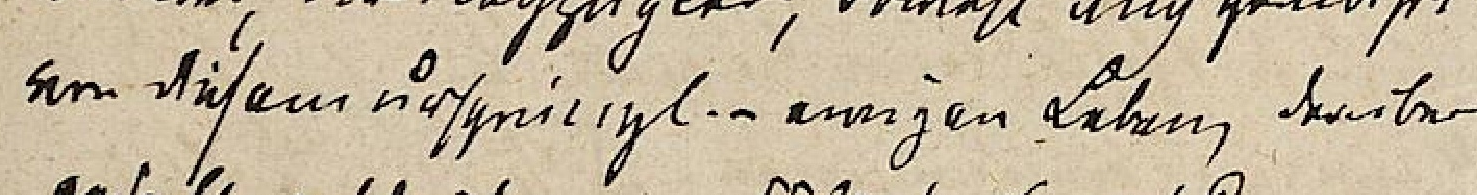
von diesem ursprüngl.-ewigen Leben, darüber
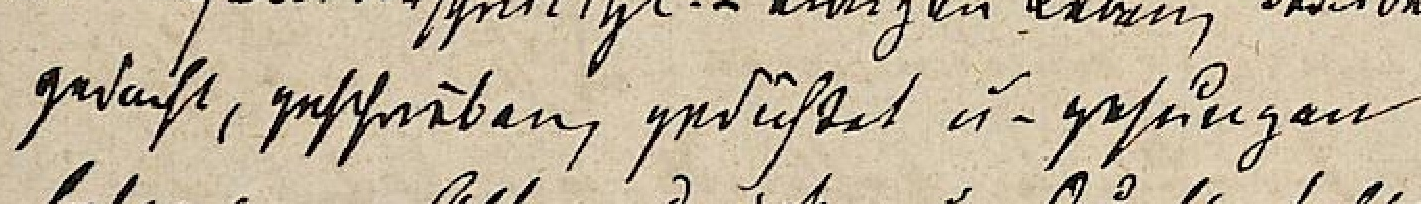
gedacht, geschrieben, gedichtet u. gesungen
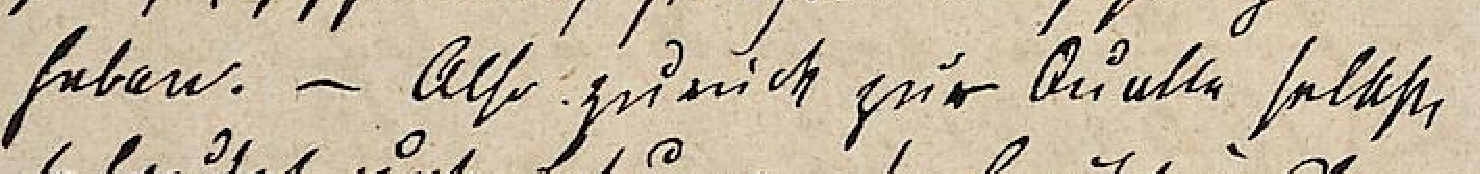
haben. _ Also zurück zur Quelle selbst,
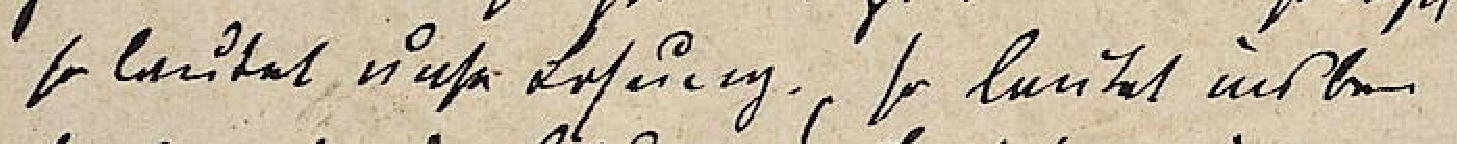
so lautet unsr Losung. so lautet insbe¬
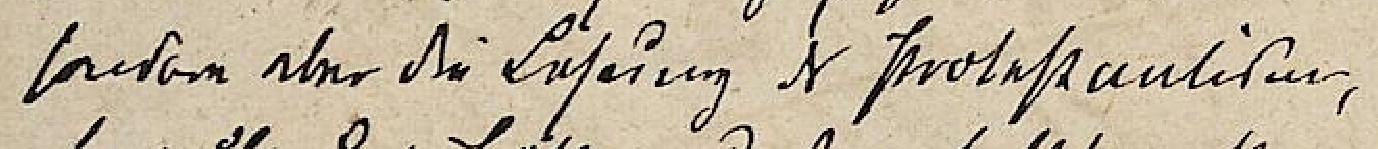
sondere aber die Losung ds Protestantism.,
